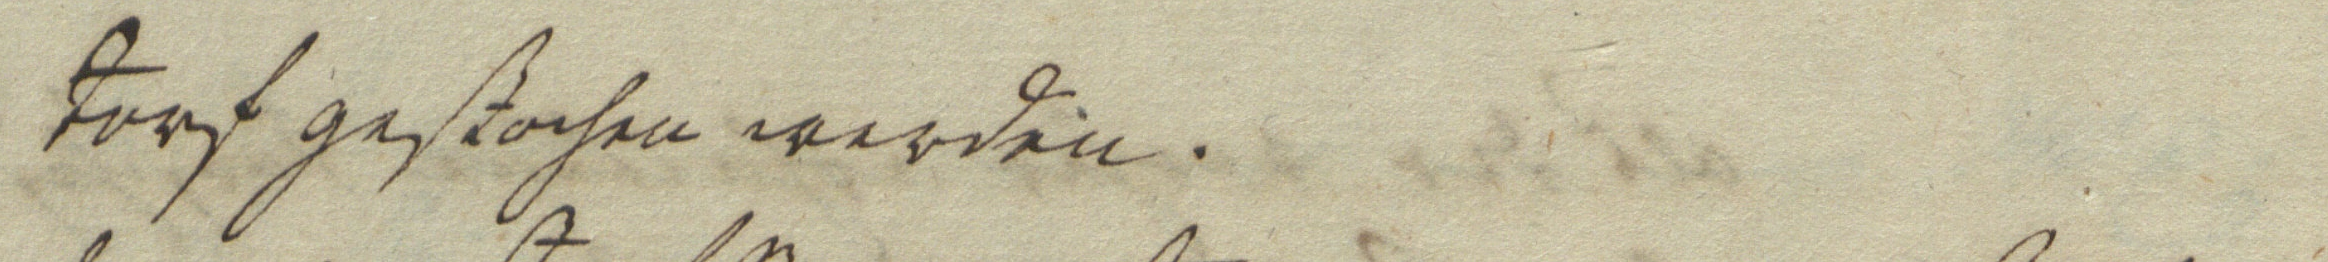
Torf gestochen werden.
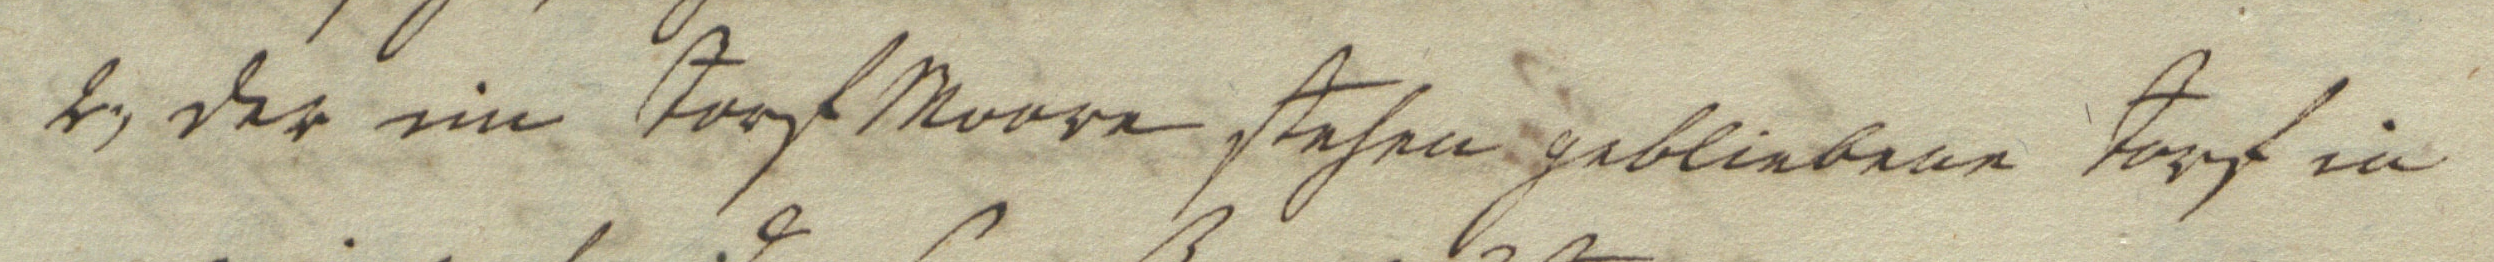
2., der im Torf Moore stehen gebliebene Torf in
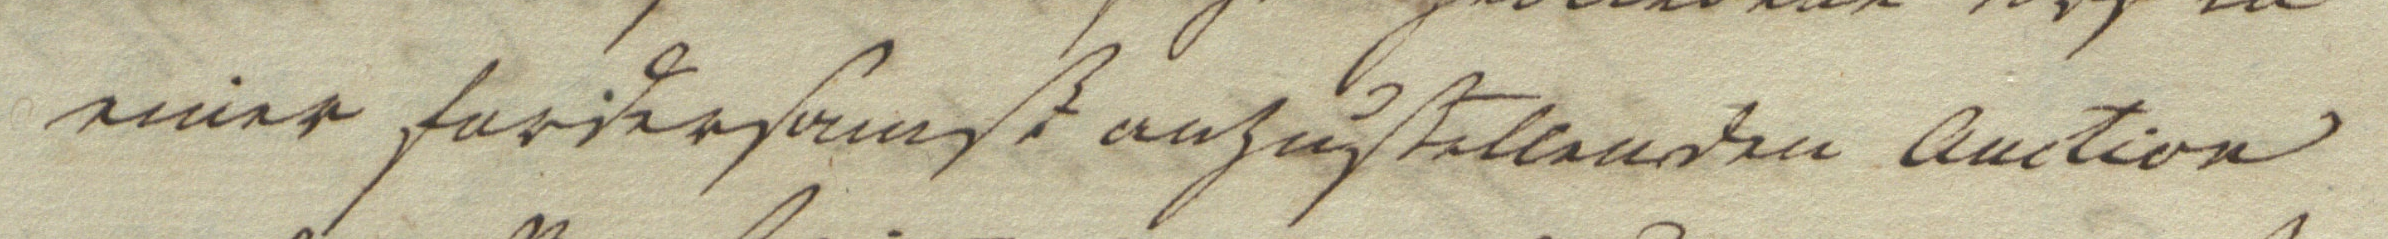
einer furdersamst anzustellenden Auction
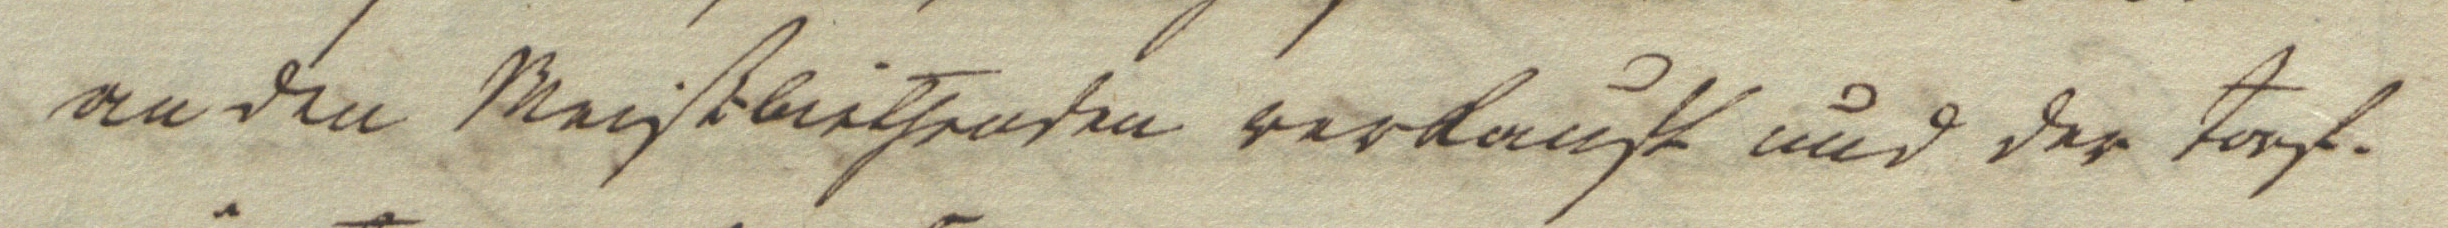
an den Meistbiethenden verkauft und der Torf¬
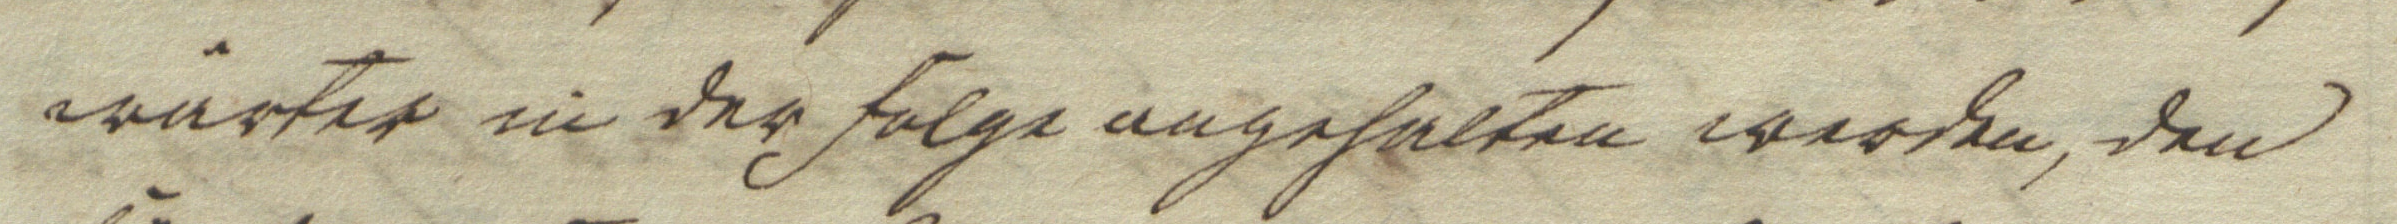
wärter in der Folge angehalten werden, den
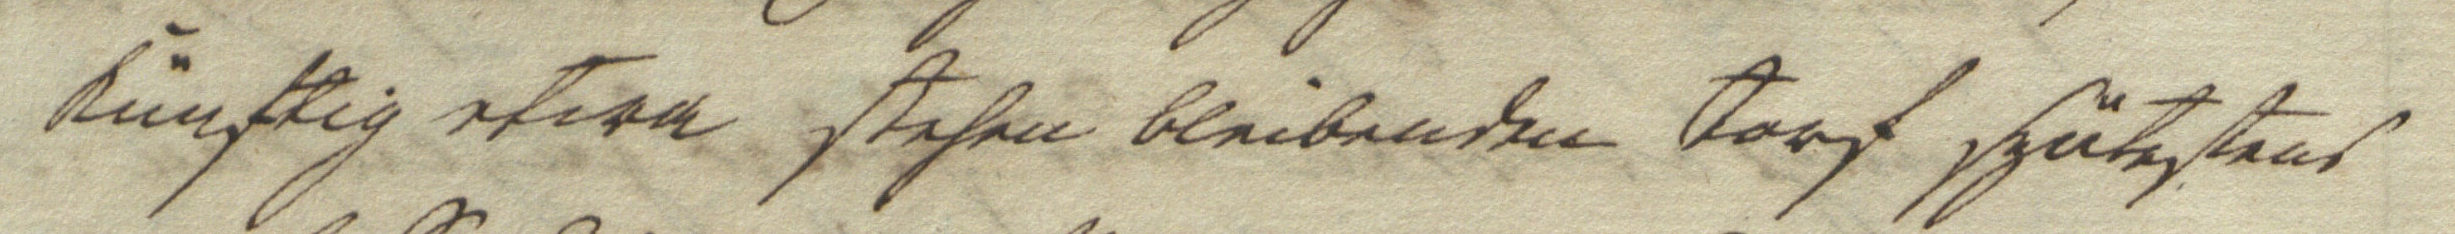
künfig etwa stehen bleibenden Torf spätestens
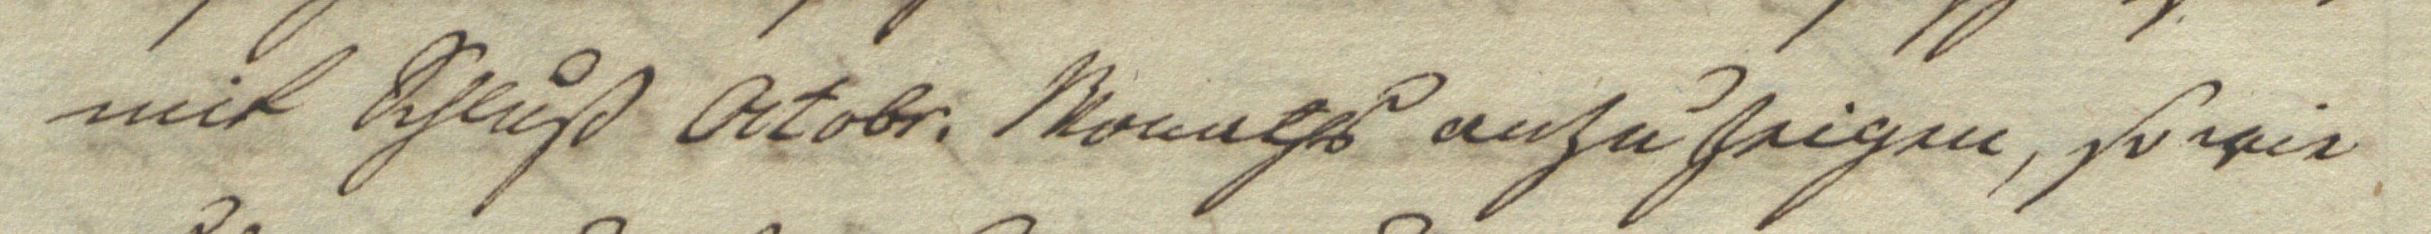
mit Schluß Octobr. Monaths anzuzeigen, so wie
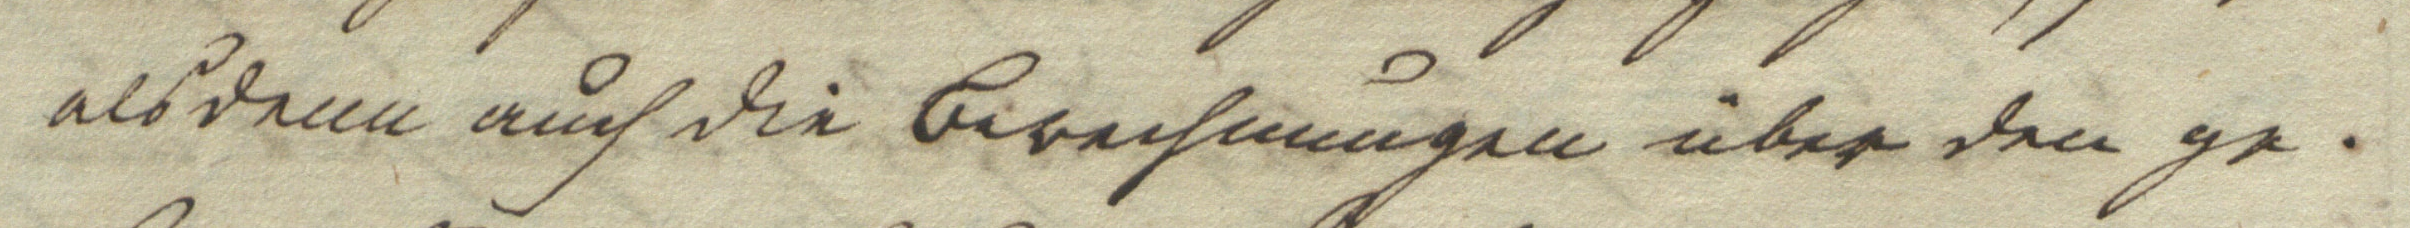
als denn auch die Berechnungen über den ge¬
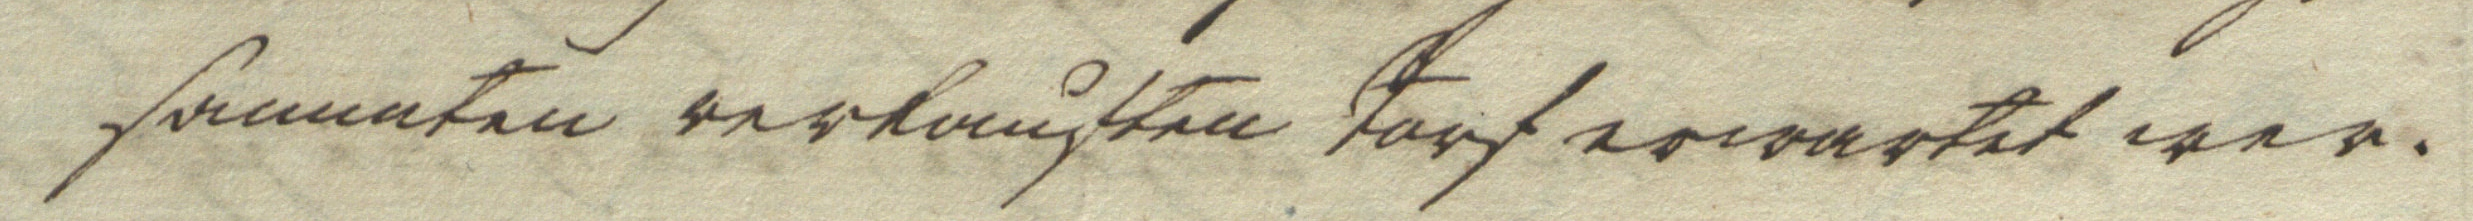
sammten verkauften Torf erwartet wer¬
